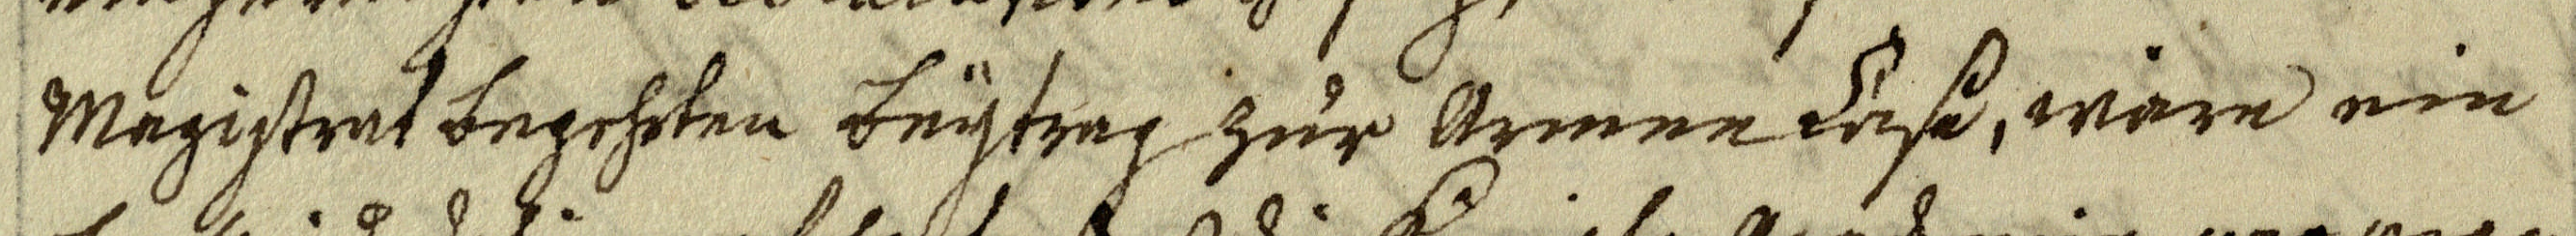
Magistrat begehrten Beÿtrag zur Armen Caßa, wäre ein
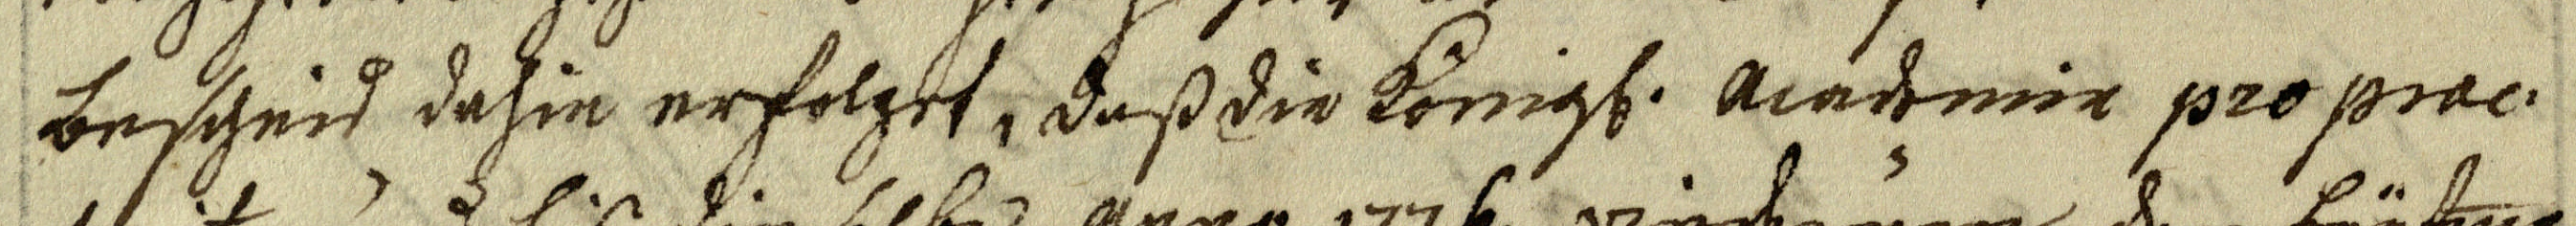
Bescheid dahin erfolget, daß die Königl: Academie pro prae¬
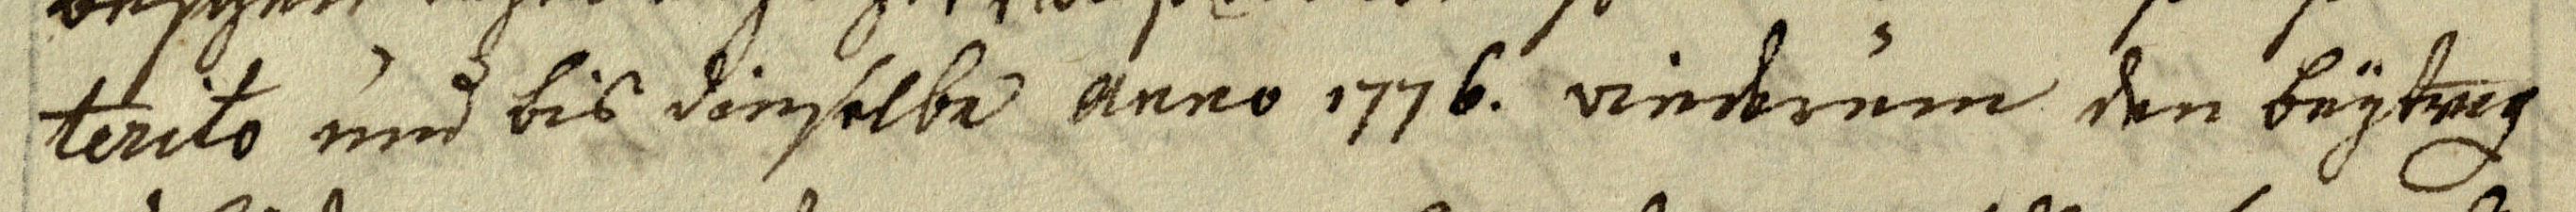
terito und bis dieselbe anno 1776. wiederum den Beÿtrag
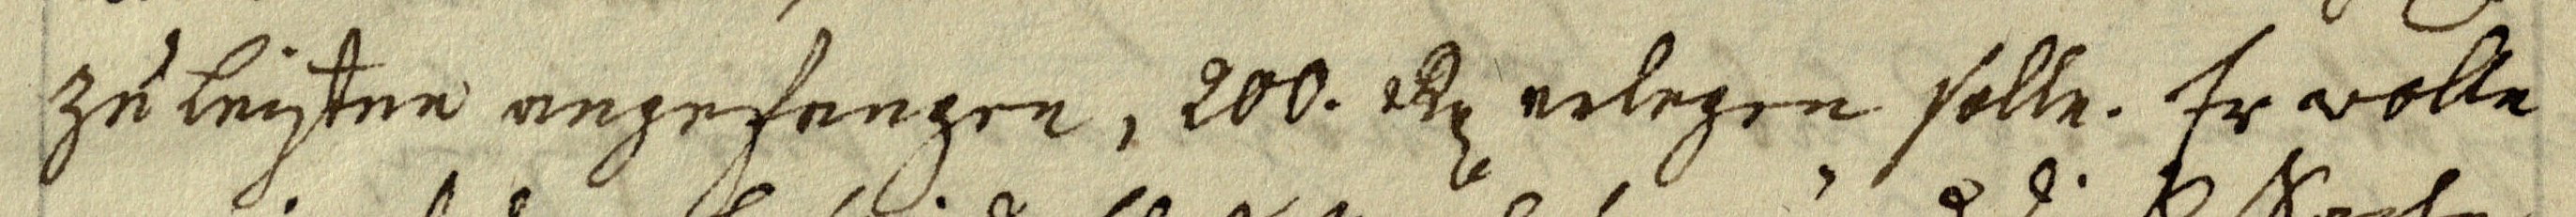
zu leisten angefangen, 200. R erlegen solle. Er wolte
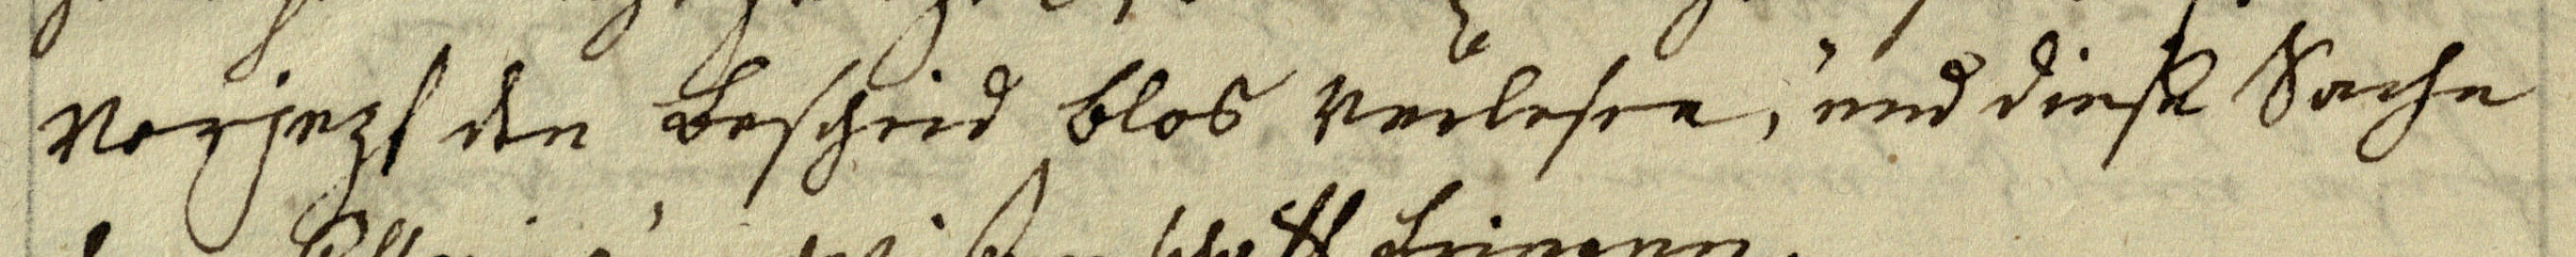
vorjezt den Bescheid blos verlesen, und diese Sache
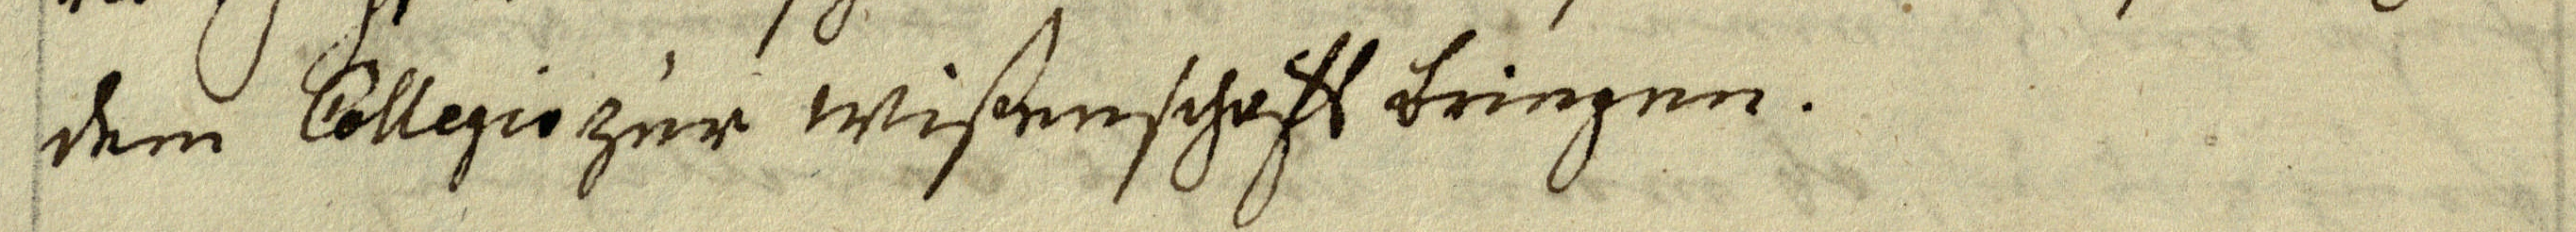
dem Collegio zur Wißenschaft bringen.
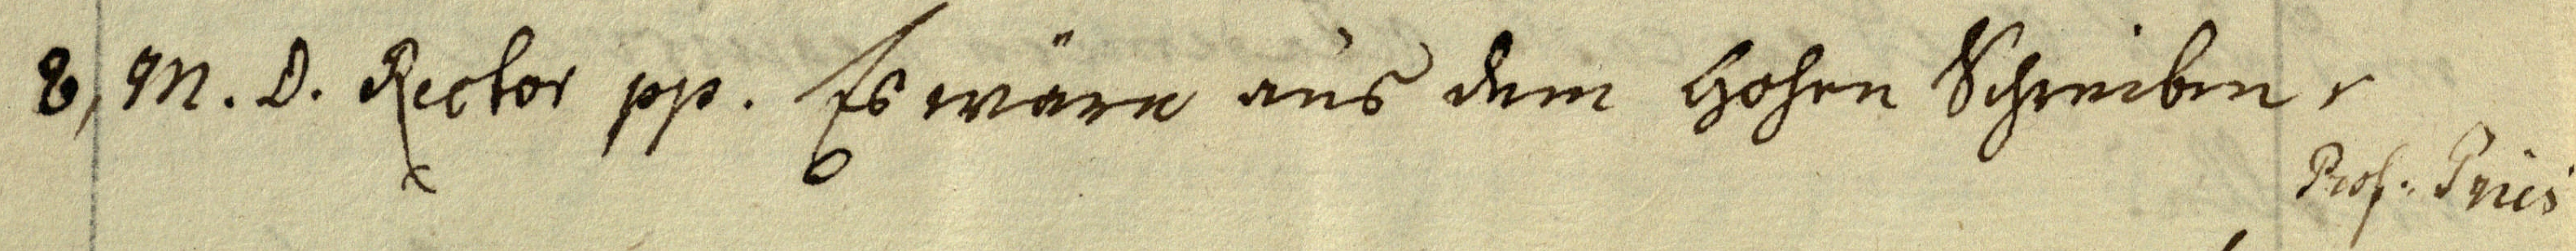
8, M.D. Rector pp. Es wäre aus dem Hohen Schreiben Prof. Pries
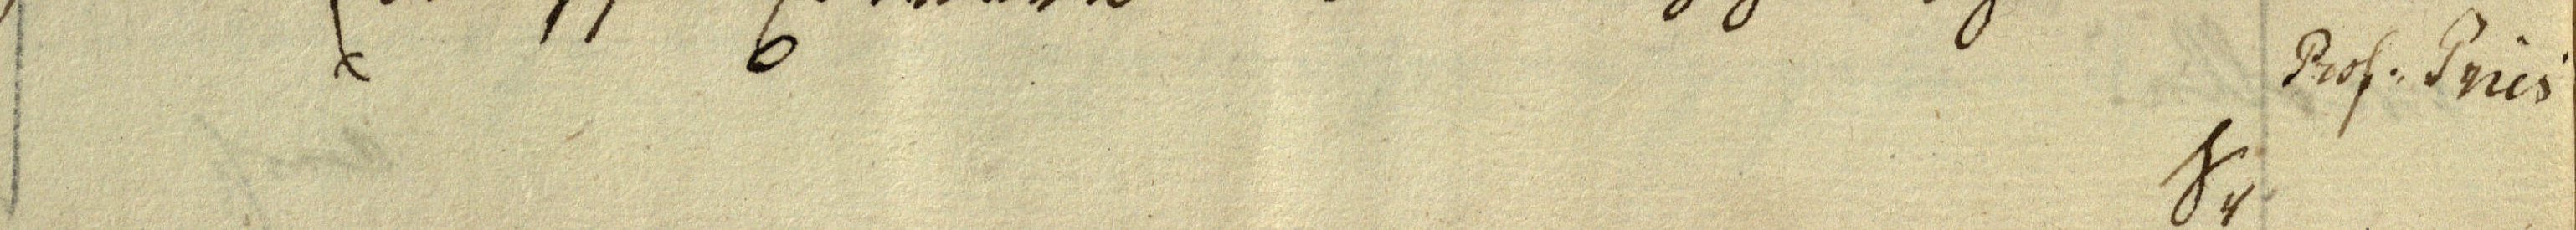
Sr
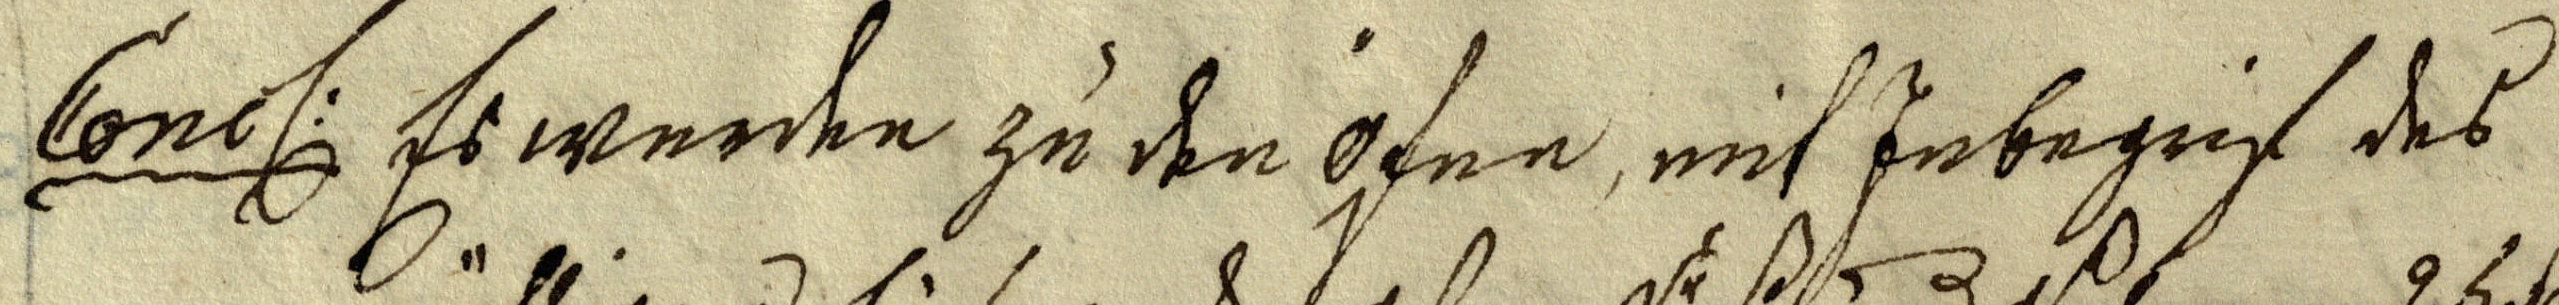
Concl.: Es werden zu den Öfen, mit Inbegrif des
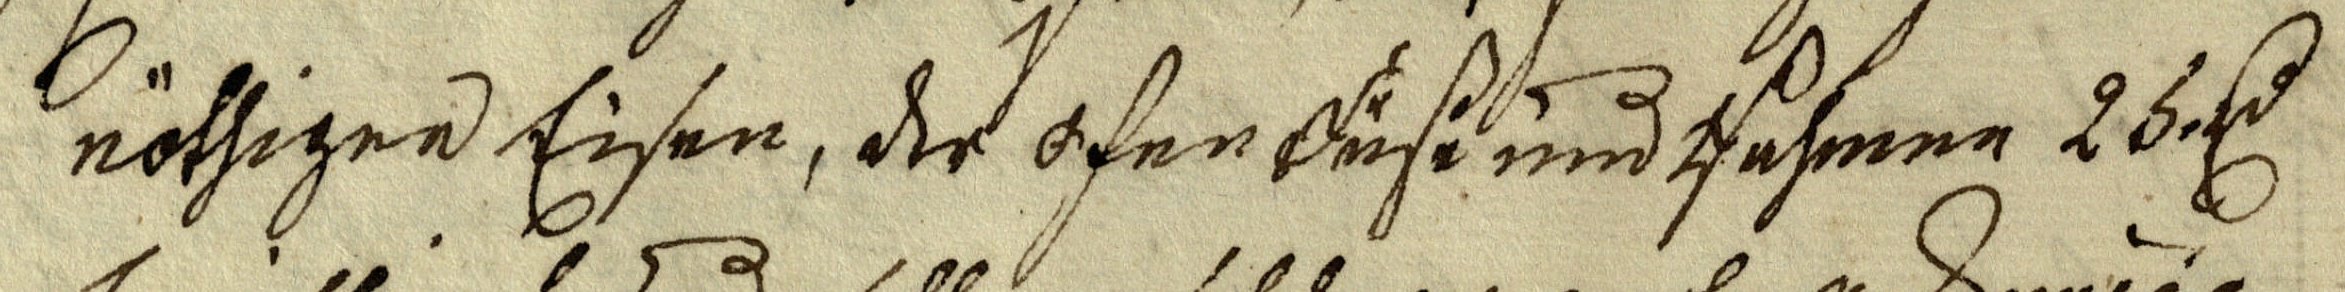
nöthigen Eisen, der Ofen Füße und Rahmen 25. r
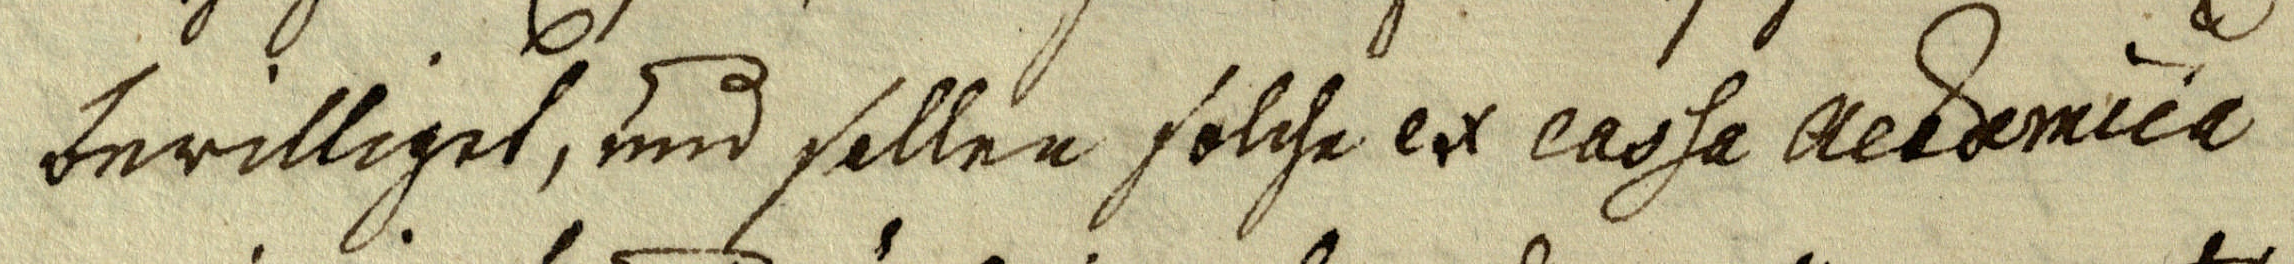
bewilliget, und sollen solche ex cassa Academica
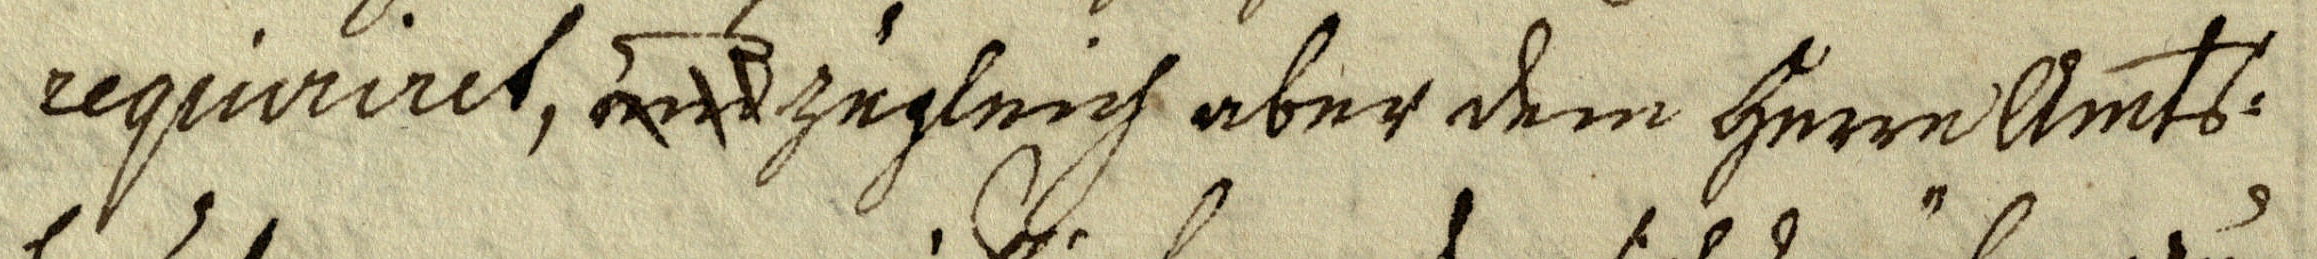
requiriret, und zugleich aber dem Herrn Amts¬
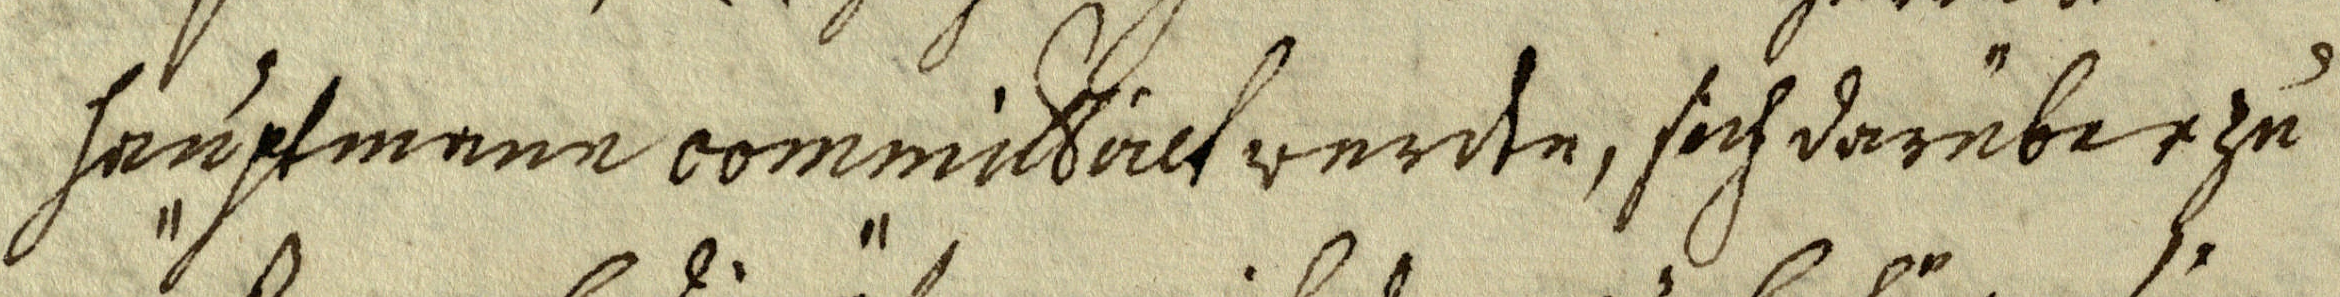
hauptmann committiret werden, sich darüber zu
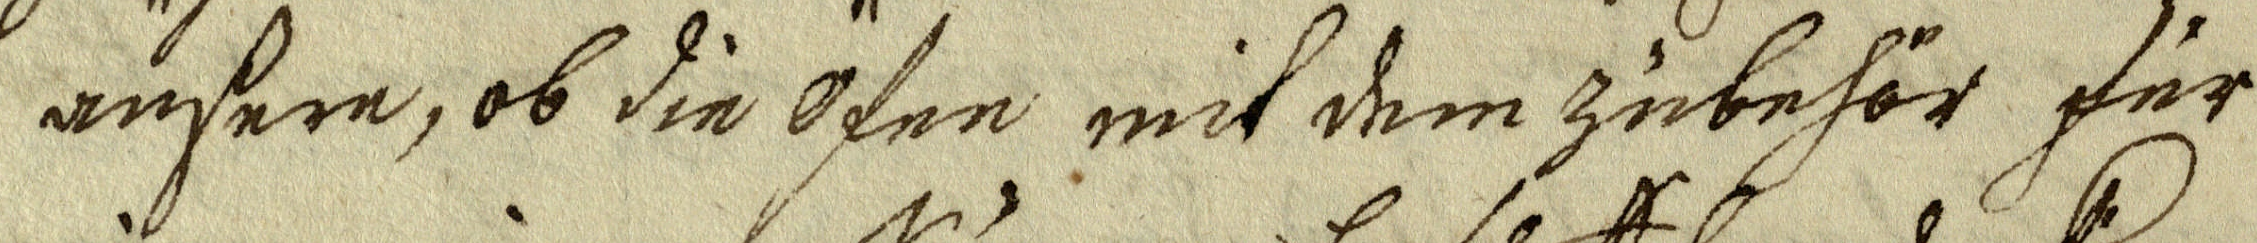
äußern, ob die Öfen mit dem Zubehör für
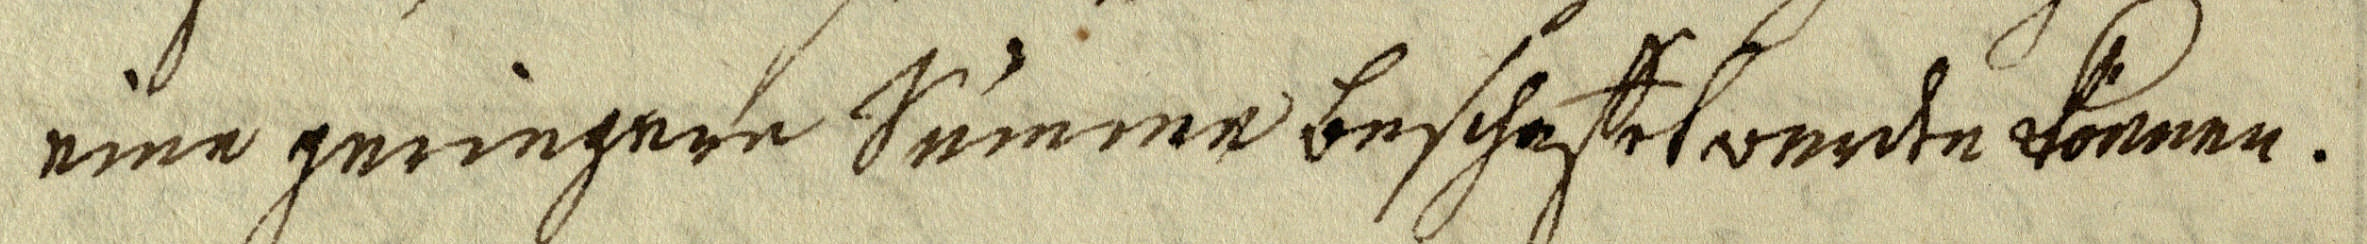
eine geringere Summe beschaffet werden können.
